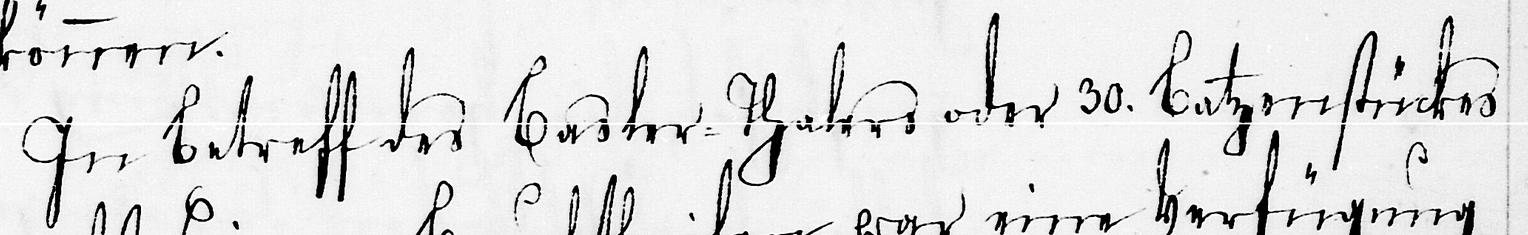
In Betreff des Basler-Thalers oder 30. Batzenstückes
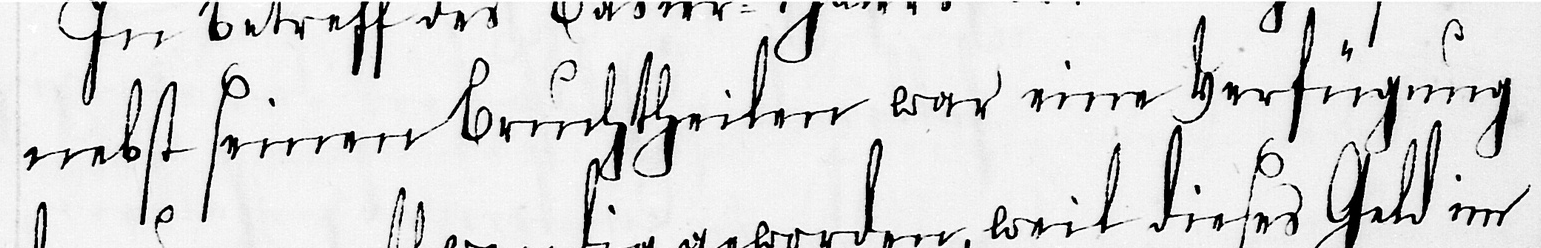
nebst seinen Bruchtheilen war eine Verfügung
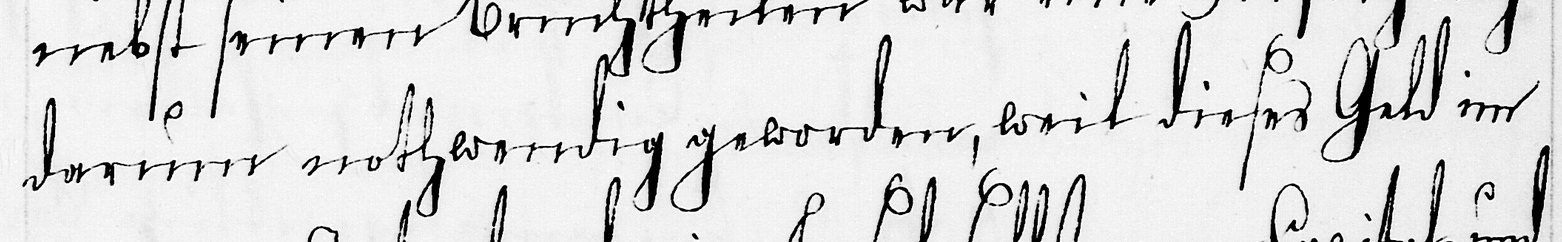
darum nothwendig geworden, weil dieses Geld im
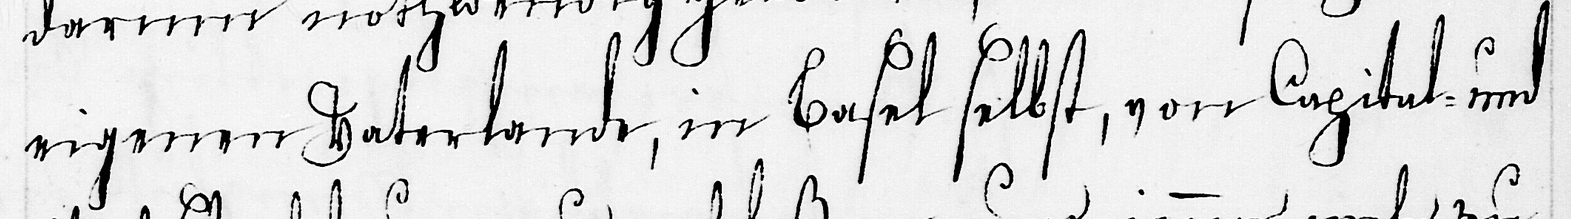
eigenen Vaterlande, in Basel selbst, von Capital- und
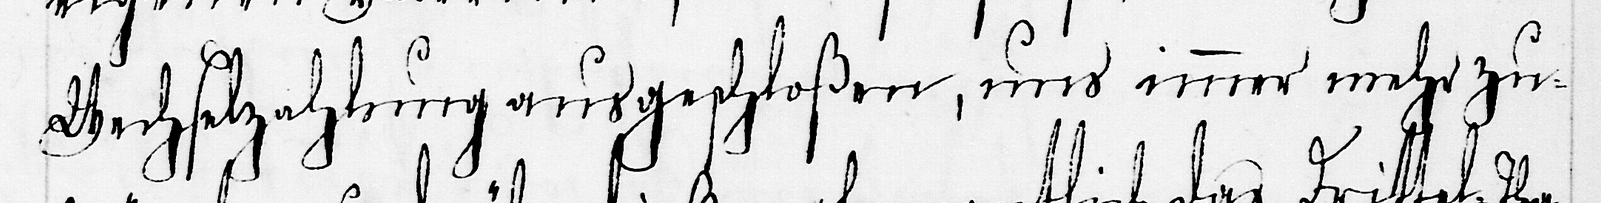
Wechselzahlung ausgeschloßen, uns immer mehr zu¬
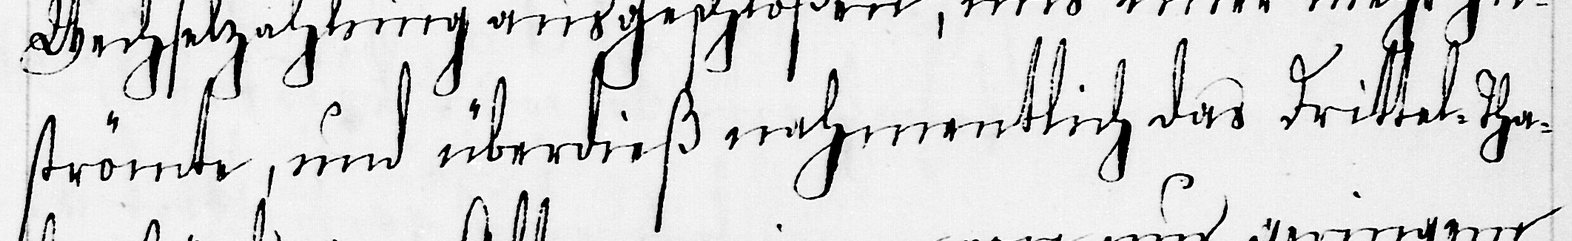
strömte, und überdieß nahmentlich das Drittel-Tha¬
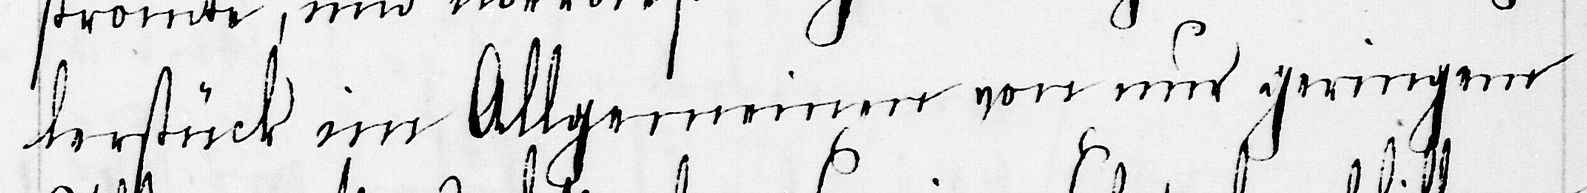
lerstück im Allgemeinen von nur geringem
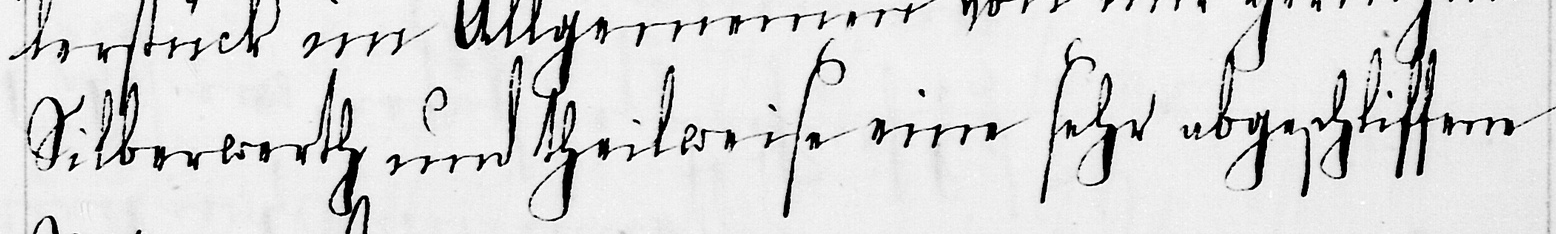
Silberwerth und theilweise eine sehr abgeschliffene
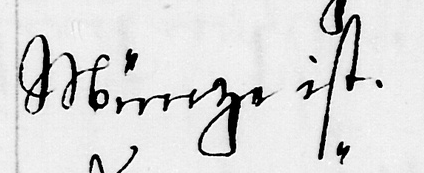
Münze ist.
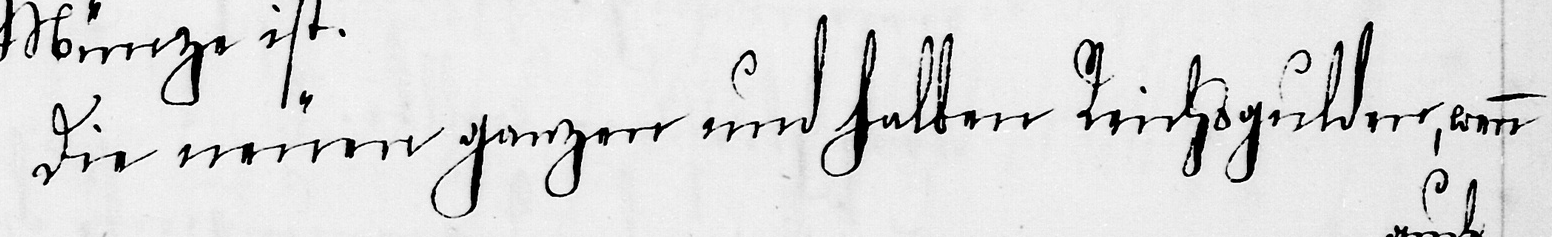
Die neuen ganzen und halben Reichsgulden, wen¬
